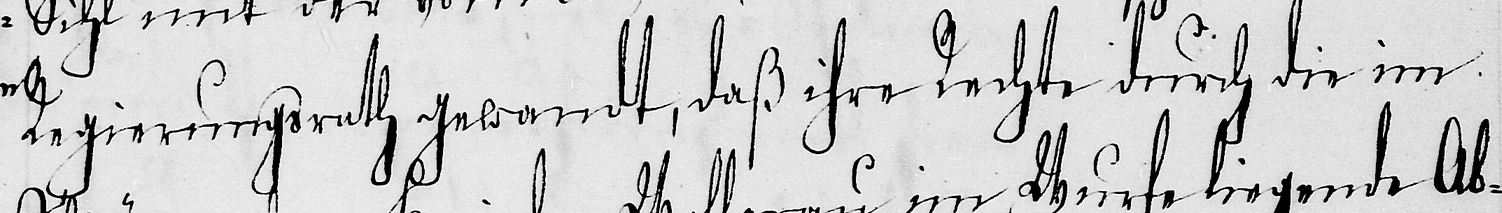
Regierungsrath gewandt, daß ihre Rechte durch die im
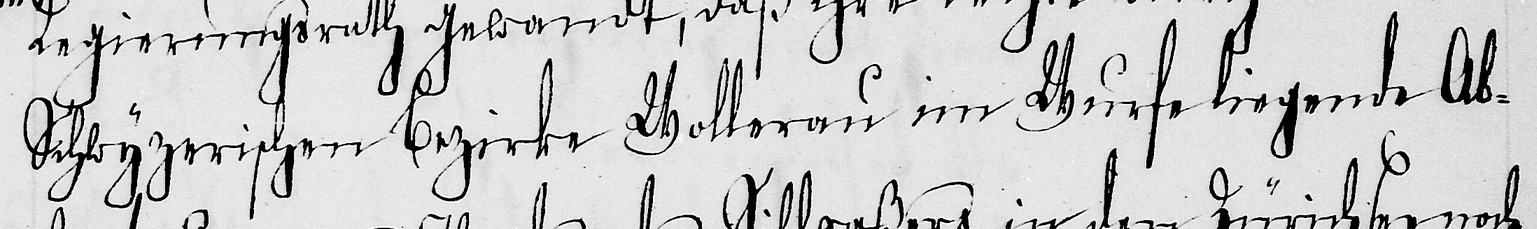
Schwyzerischen Bezirke Wollerau im Wurfe liegende Ab¬
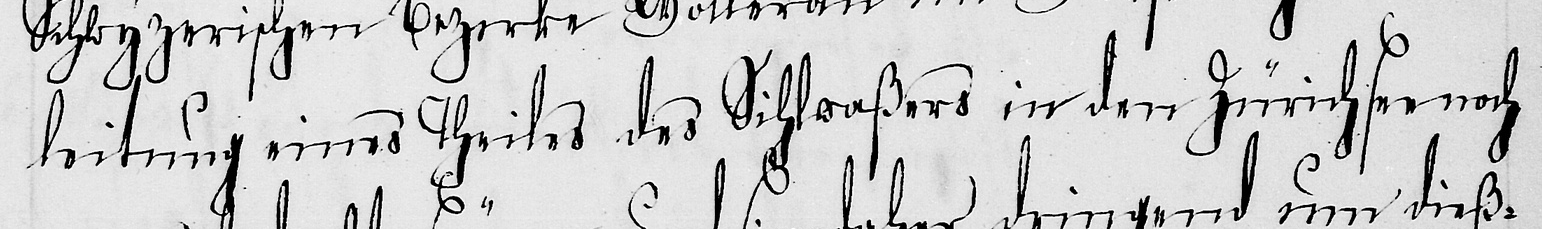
leitung eines Theils des Sihlwaßers in den Zürichsee noch
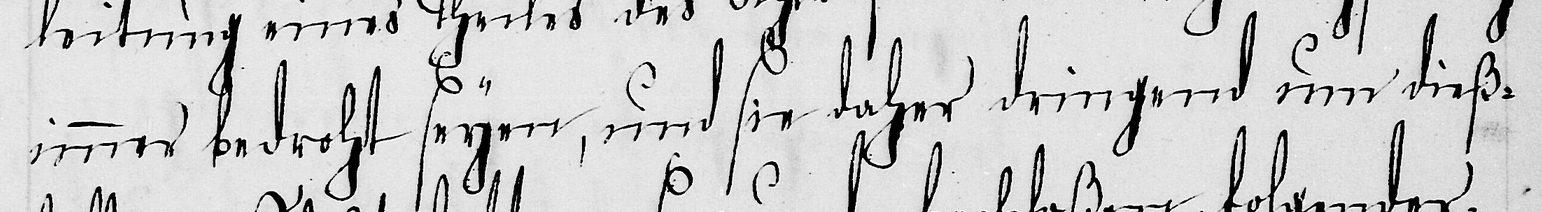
immer bedroht seyen, und sie daher dringend um dießf¬
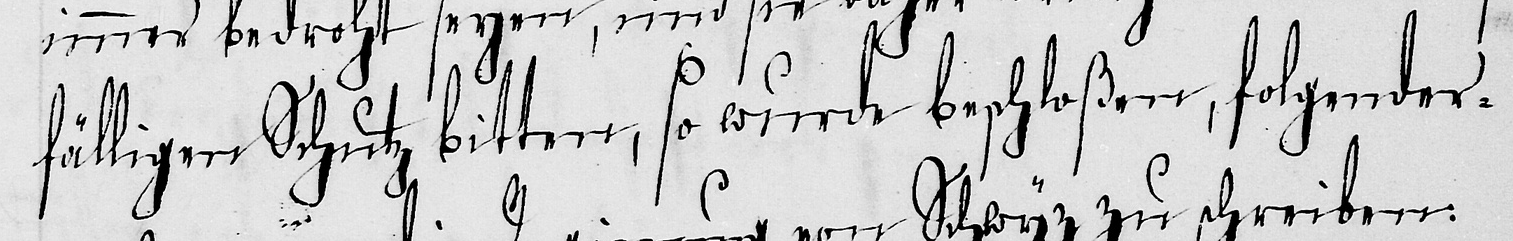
älligen Schutz bitten, so wurde beschloßen, folgender¬
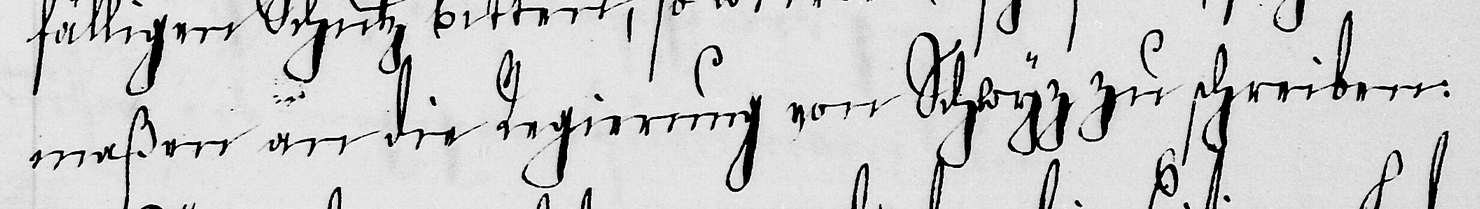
maßen an die Regierung von Schwyz zu schreiben:
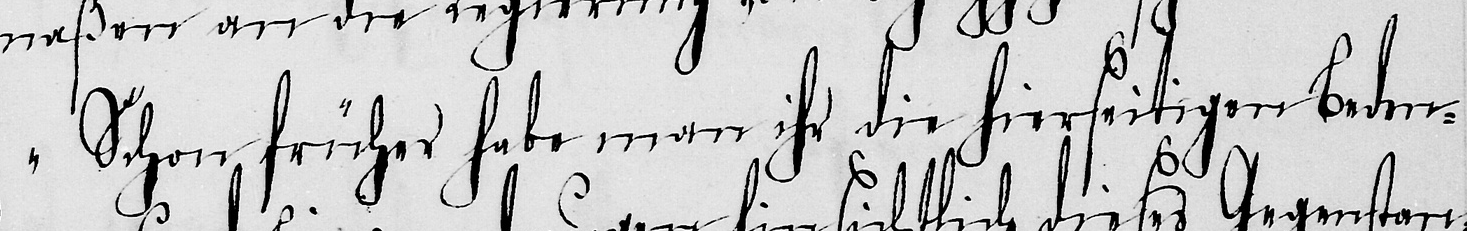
„Schon früher habe man ihr die hierseitigen Beden¬
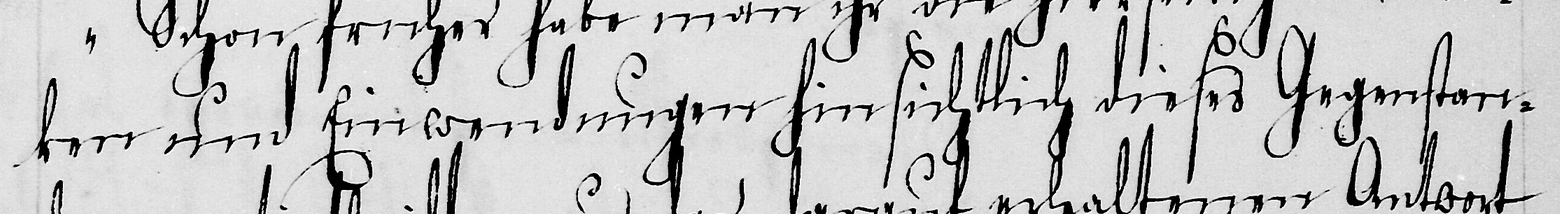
ken und Einwendungen hinsichtlich dieses Gegenstan¬
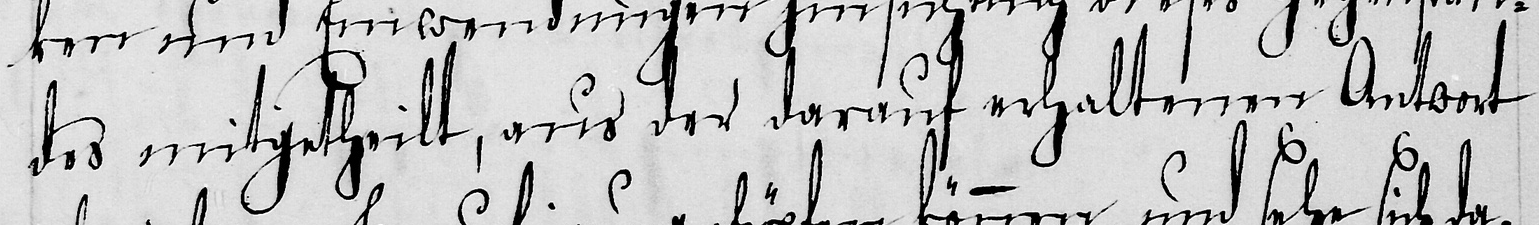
des mitgetheilt, aus der darauf erhaltenen Antwort
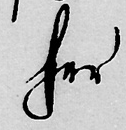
er
